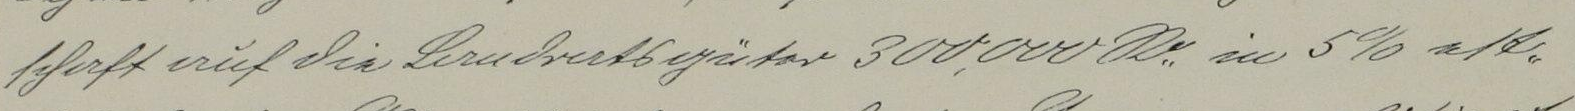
schaft auf die Landratsgüter 300.000 R. in 5% est-
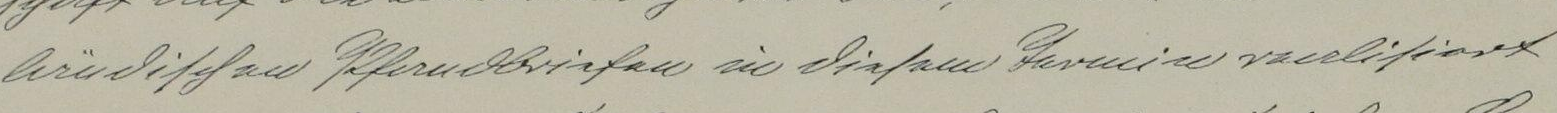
ländischen Pfandbriefen in diesem Termin realisiert
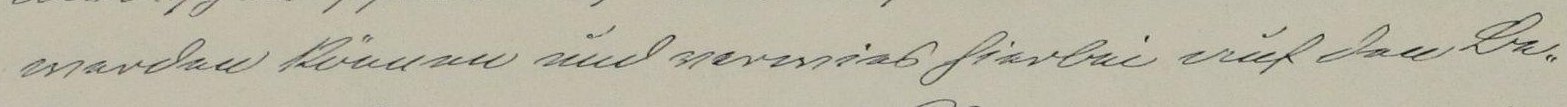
werden können und verwies hierbei auf den Be-
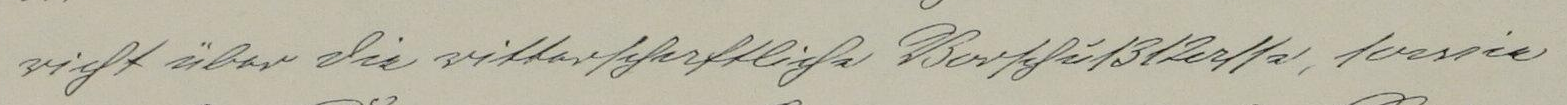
richt über die ritterschaftliche Vorschußkasse, sowie
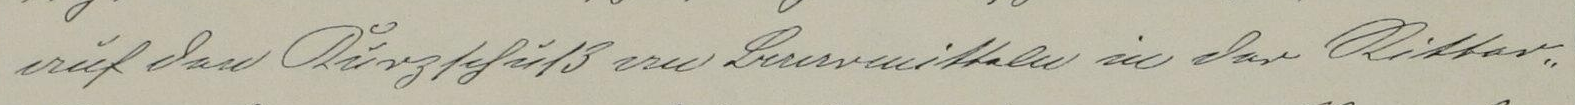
auf den Kurzschuß an Baarmitteln in der Ritter-
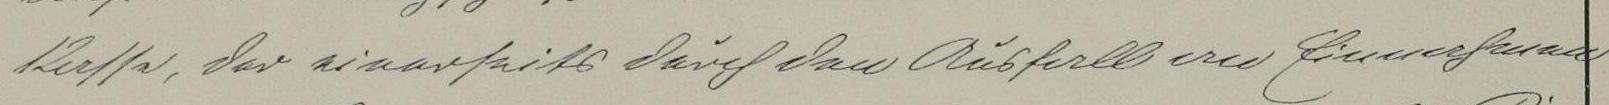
kasse, der einerseits durch den Ausfall an Einnahmen
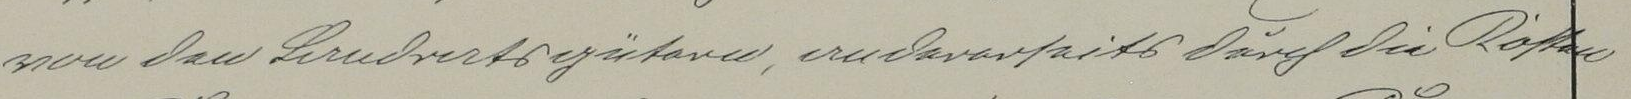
von den Landratsgütern, andererseits durch die Kosten
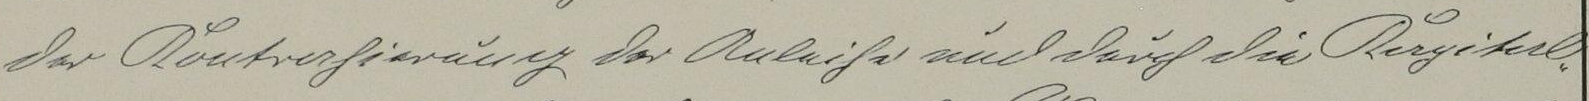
der Kontrahierung der Anleihe und durch die Kapital-
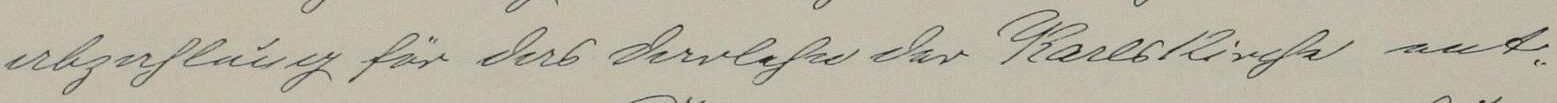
abzahlung für das Darlehn der Karlskirche ent-
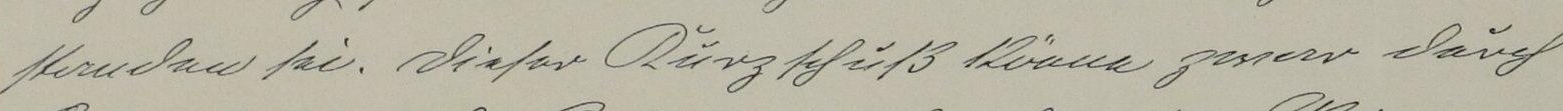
standen sei. Dieser Kurzschuß könne zwar durch
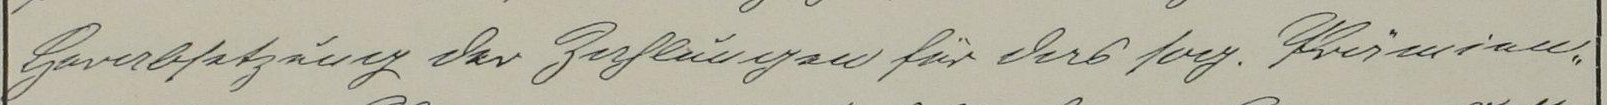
Herabsetzung der Zahlungen für das sog. Prämien-
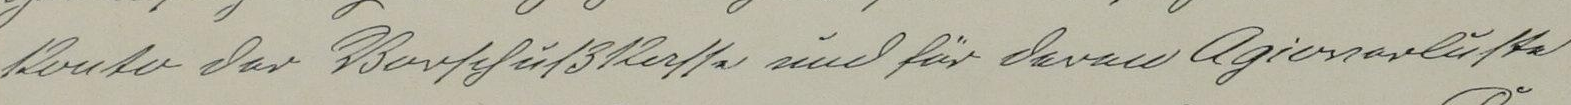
konto der Vorschußkasse und für deren Agioverluste
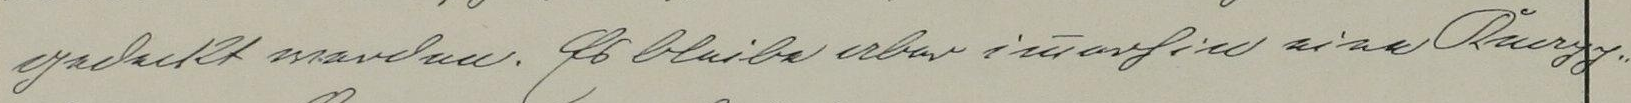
gedeckt werden. Es bleibe aber immerhin eine Knapp-
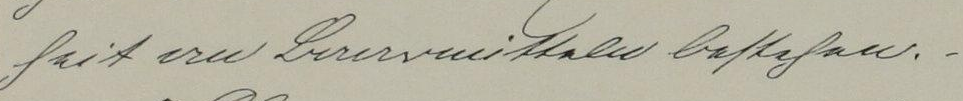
heit an Baarmitteln bestehen.
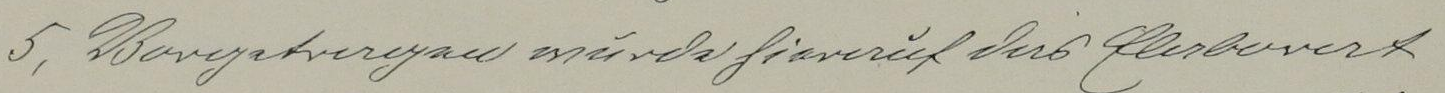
5. Vorgetragen wurde hierauf das Elaborat
